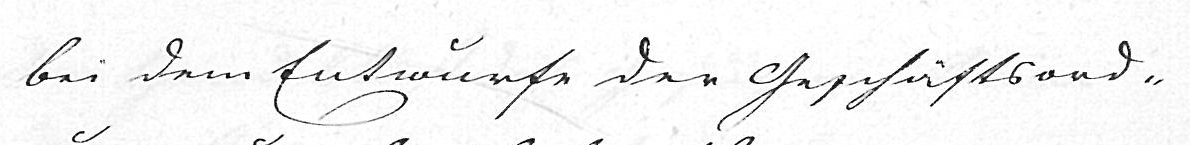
bei dem Entwurfe der Geschäftsord-
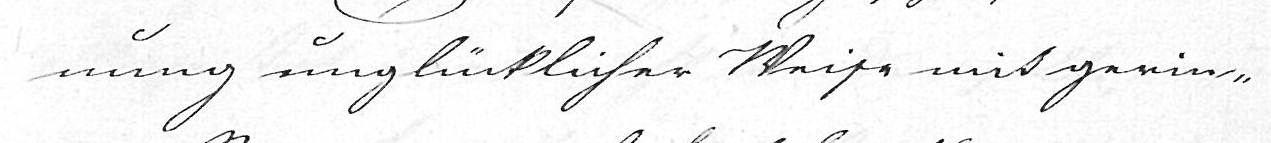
nung unglücklicher Weise mit gerin-
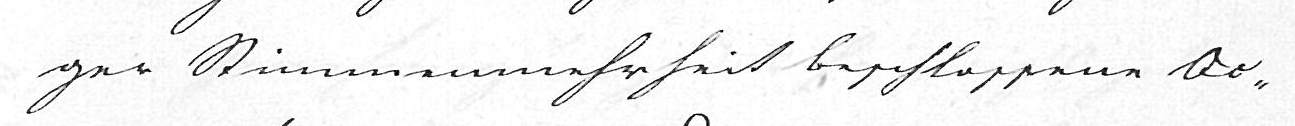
ger Stimmenmehrheit beschlossene Oc-
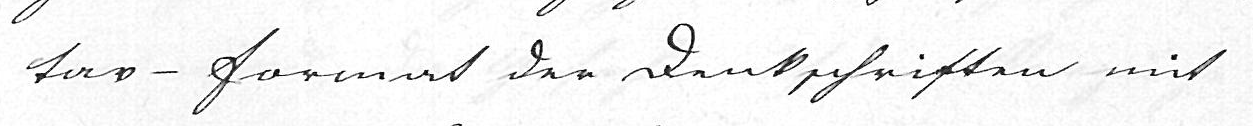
tav-Format der Denkschriften mit
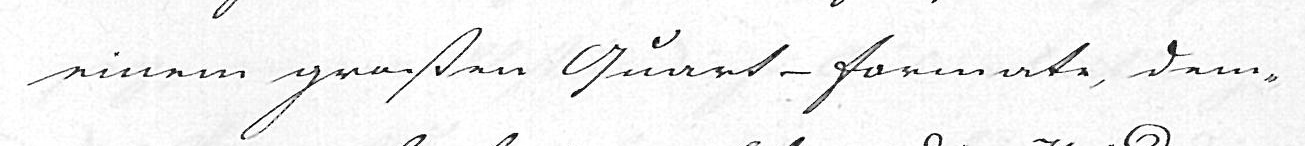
einen großen Quart-Formate, dem-
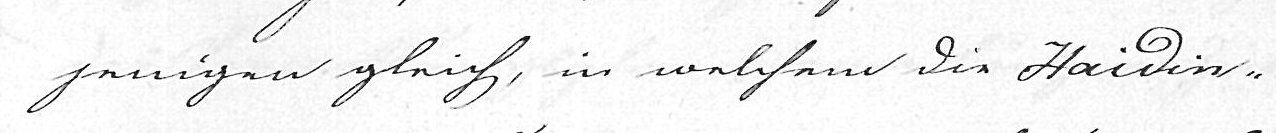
jenigen gleich, in welchem die Haidin-
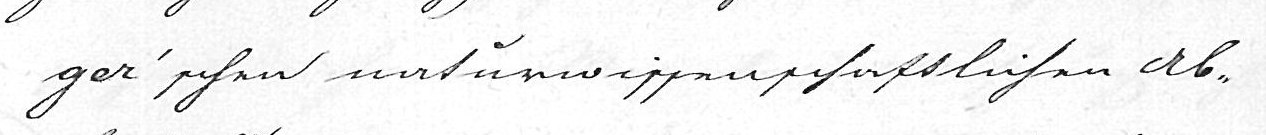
ger'schen naturwissenschaftlichen Ab-
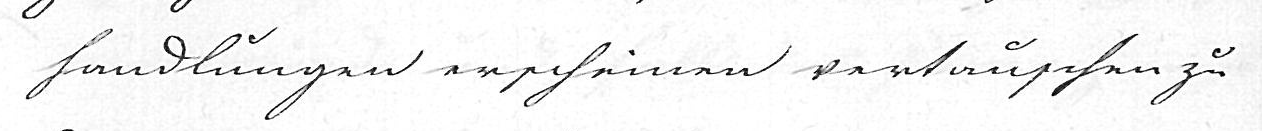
handlungen erscheinen vertauschen zu
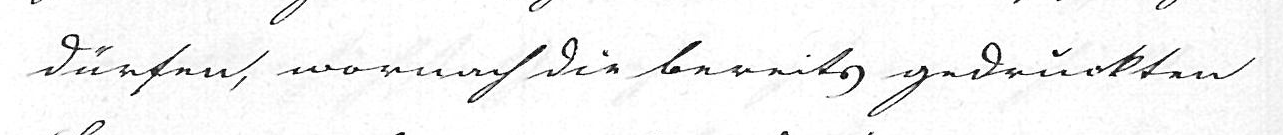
dürfen, wornach die bereits gedruckten
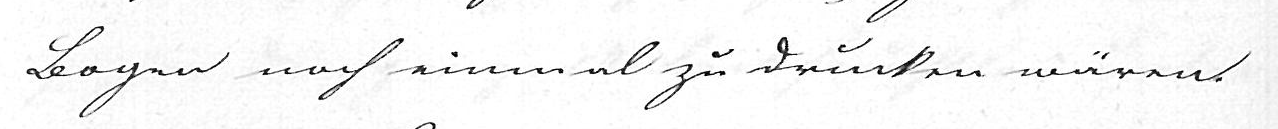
Bogen noch einmal zu drucken wären.
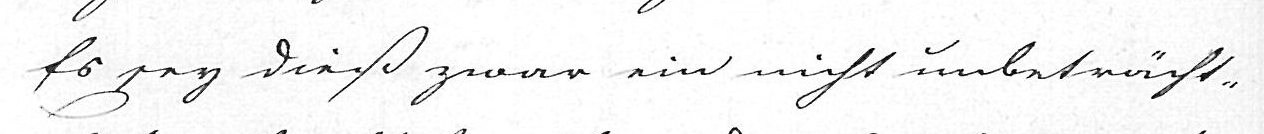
Es sey dieß zwar ein nicht unbeträcht-
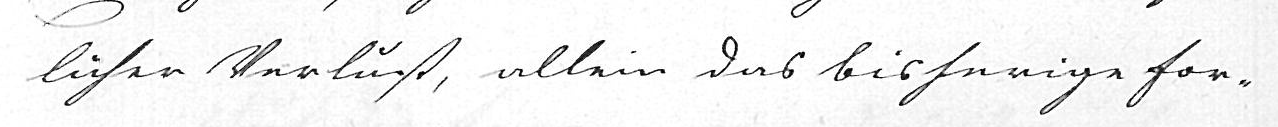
licher Verlust, allein das bisherige For-
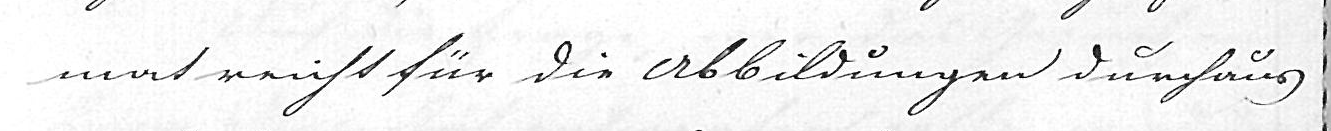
mat reicht für die Abbildungen durchaus
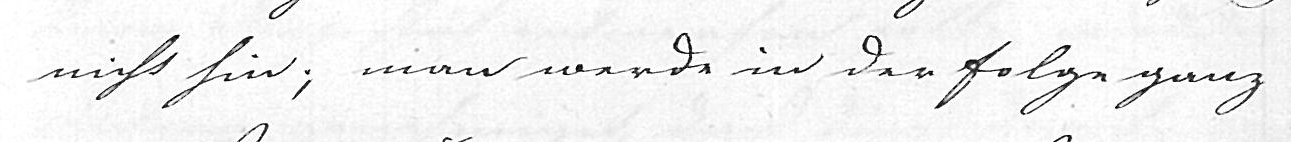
nicht hin; man werde in der Folge ganz
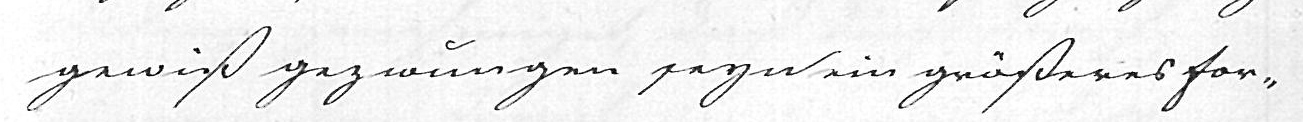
gewiß gezwungen seyn ein größeres For-
